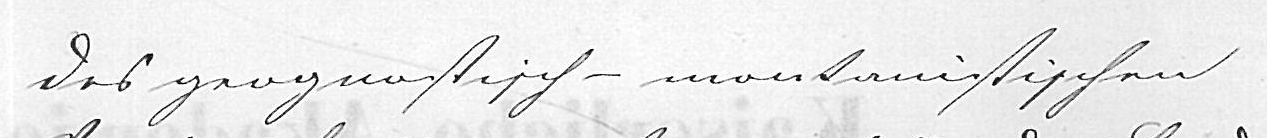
des geognostisoch-montanistischen
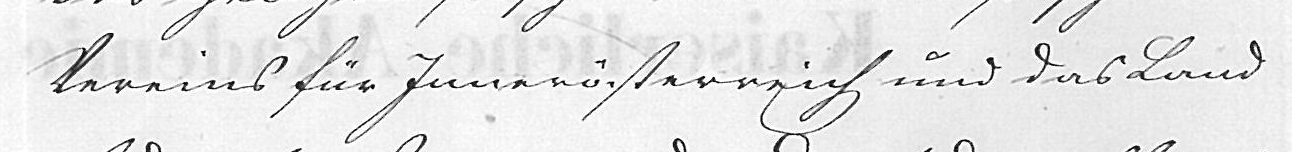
Vereins für Innerösterreich und das Land
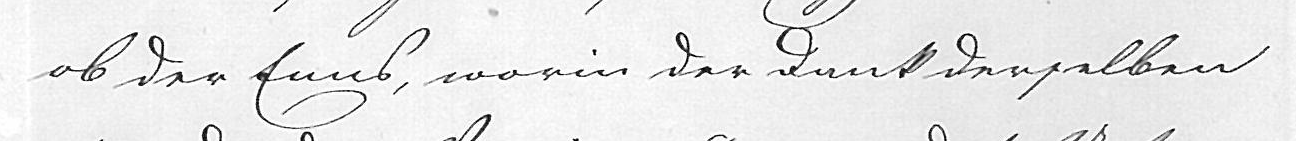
ob der Enns, worin der dank derselben
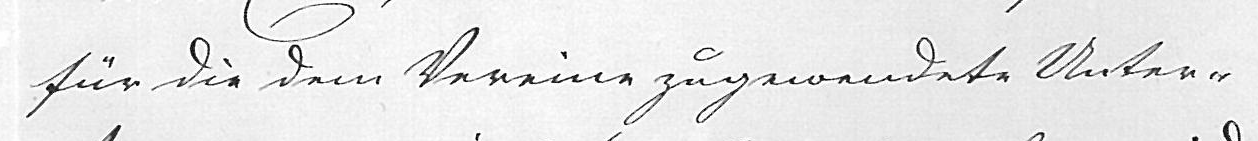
für die dem Vereine zugewendete Unter-
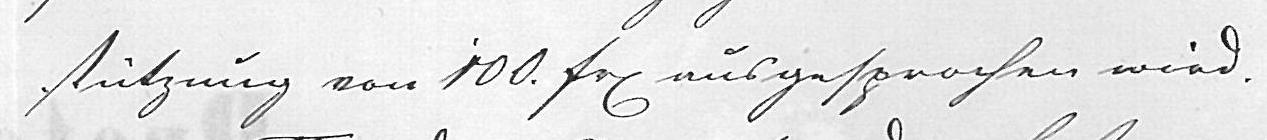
stützung von 100 fl ausgesprochen wird.
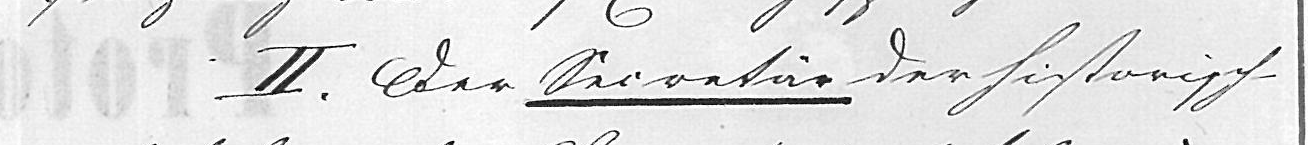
II. Der Secretär der historisch-
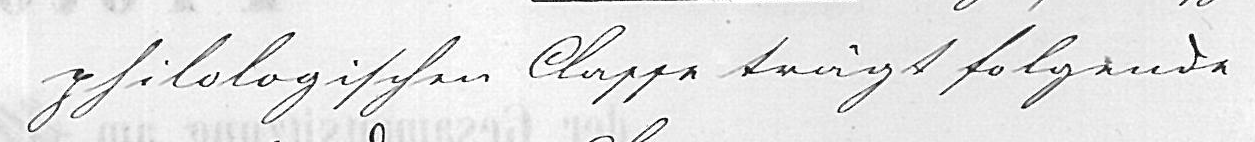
philologischen. Classe trägt folgende
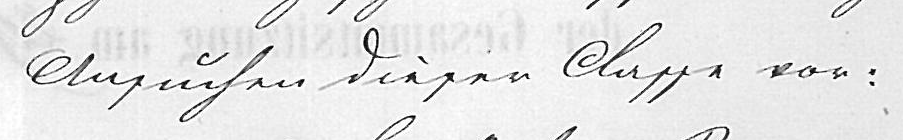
Ansuchen dieser Classe vor:
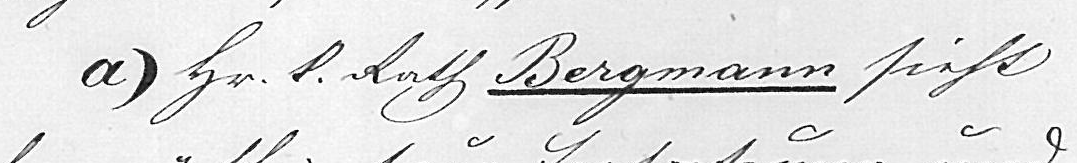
a) Hr. K. Rath Bergmann sieht
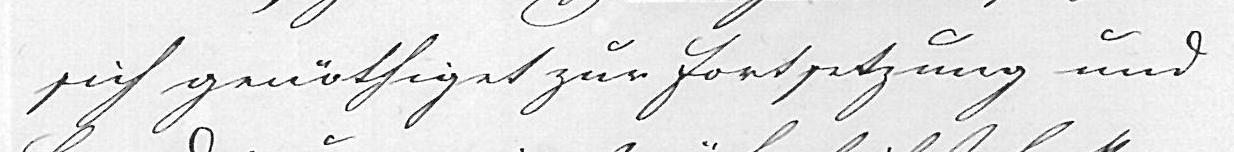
sich genöthiget zur Fortsetzung und
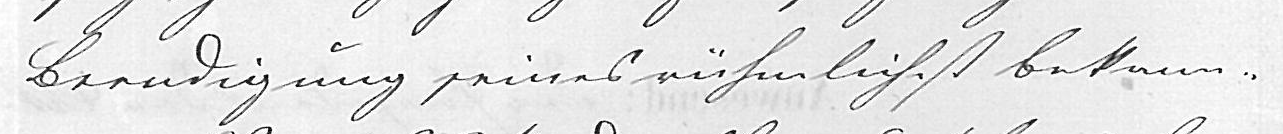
Beendigung seines rühmlichst bekann-
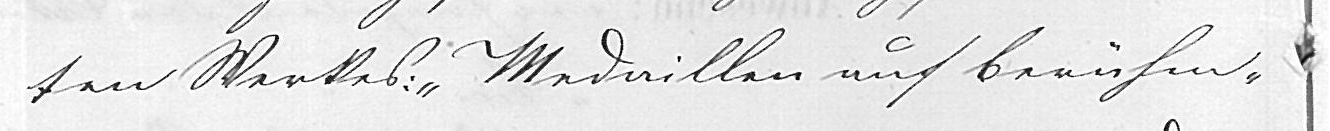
ten Werkes: "Medaillen auf berühm-
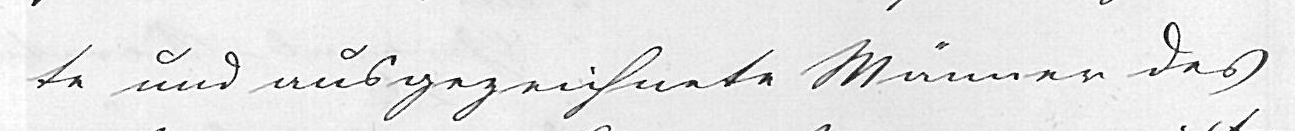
te und ausgezeichneter Männer des
